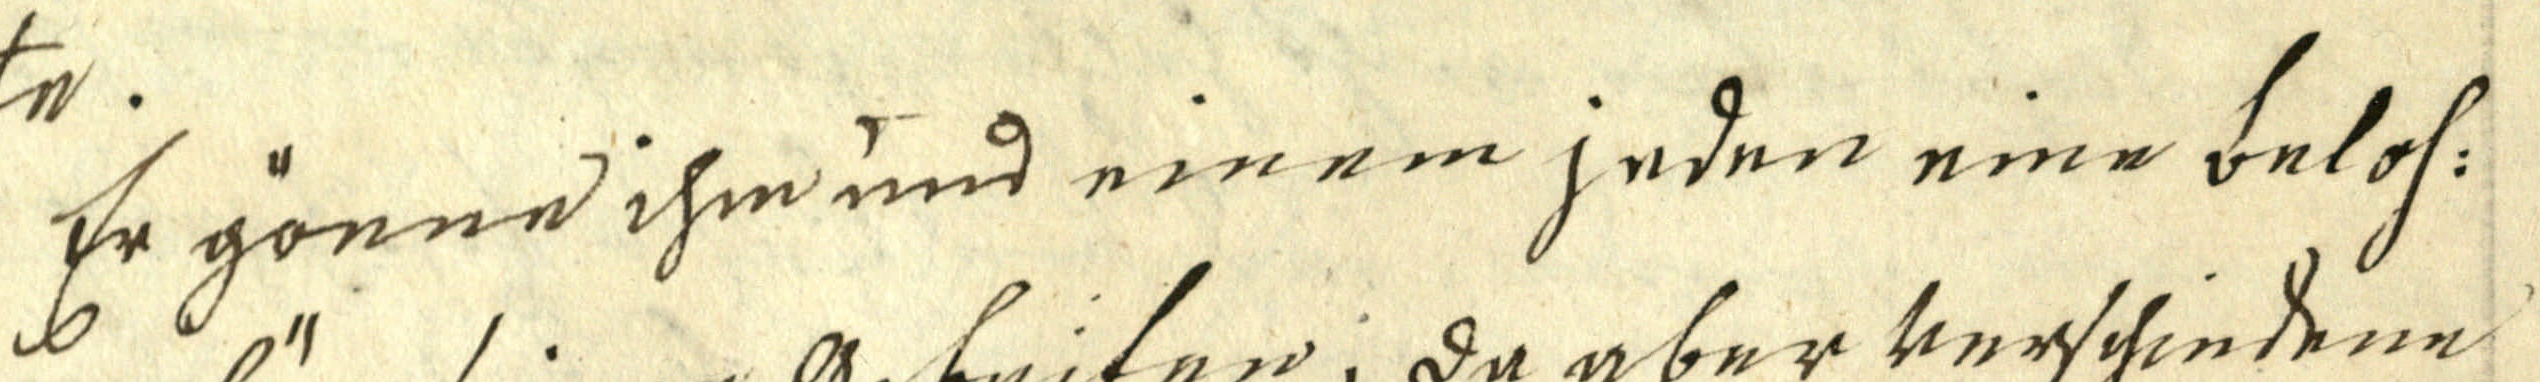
Er gönne ihm und einem jeden eine Beloh¬
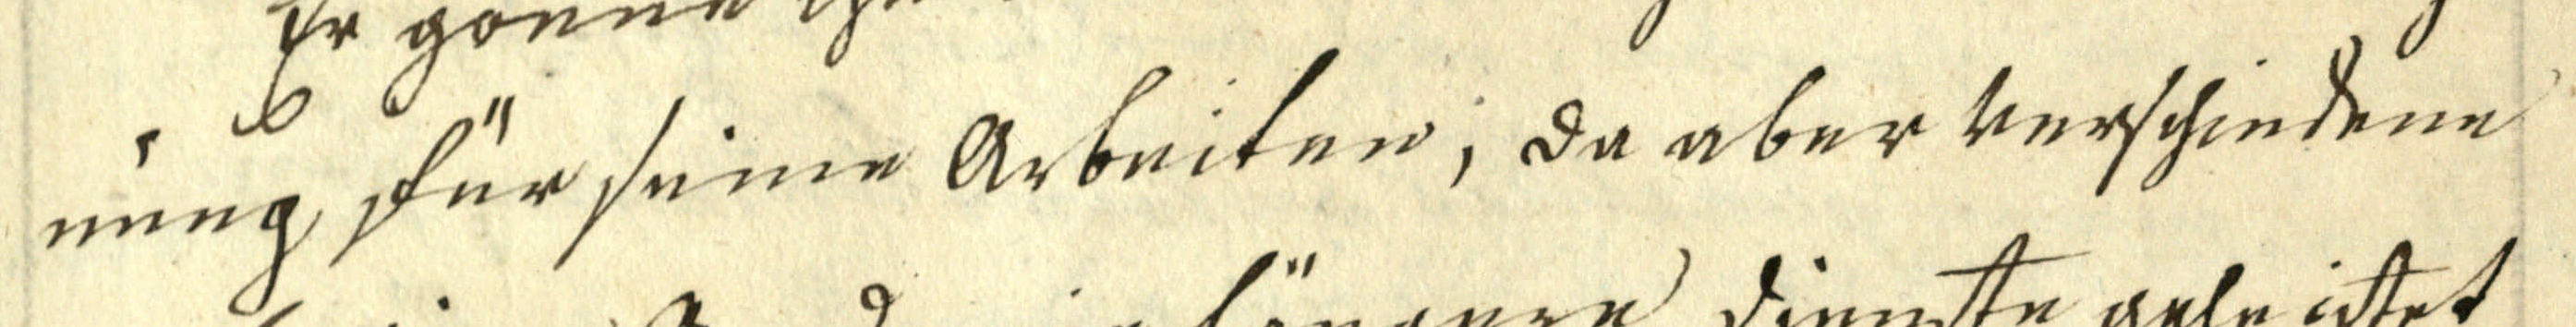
nung für seine Arbeiten, da aber verschiedene
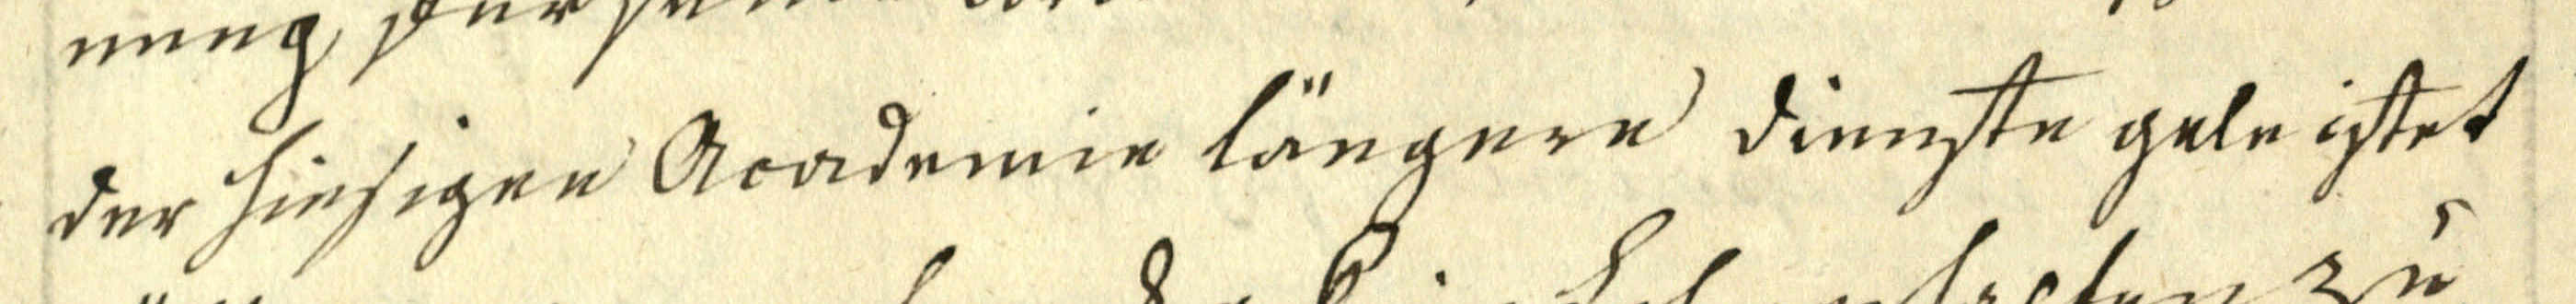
der hiesigen Academie längere dienste geleistet
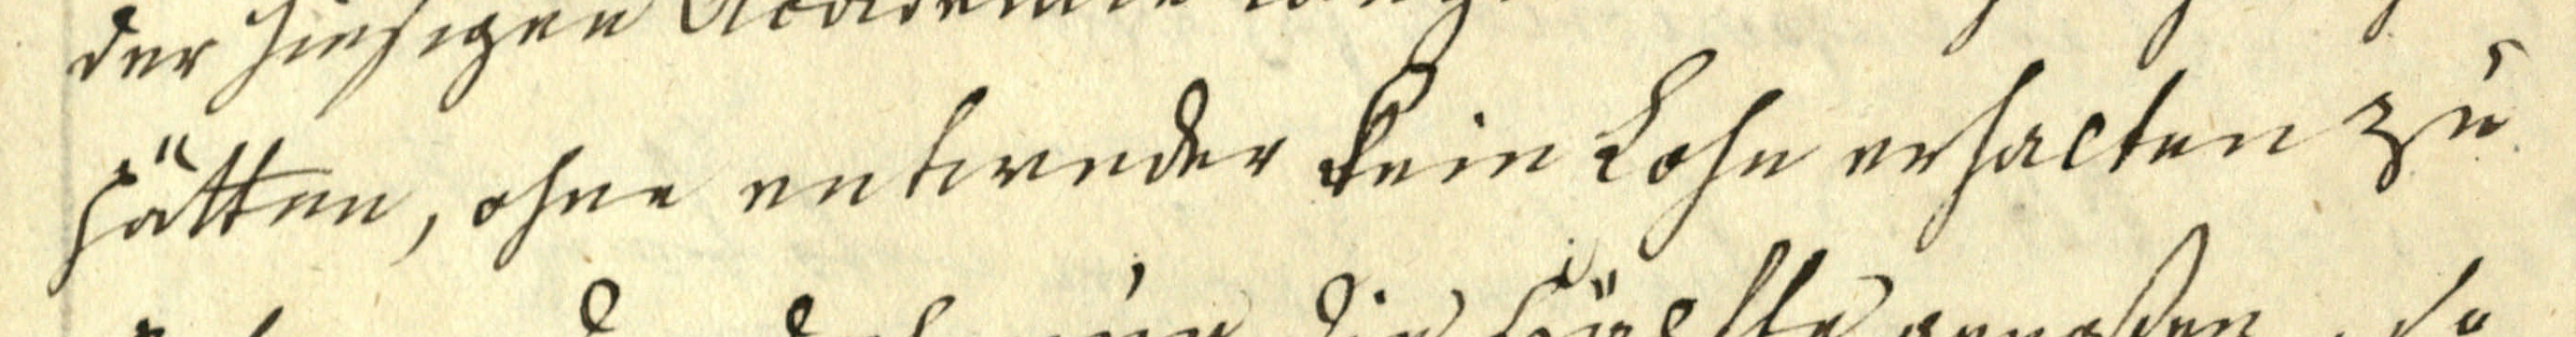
hätten, ohne entweder kein Lohn erhalten zu
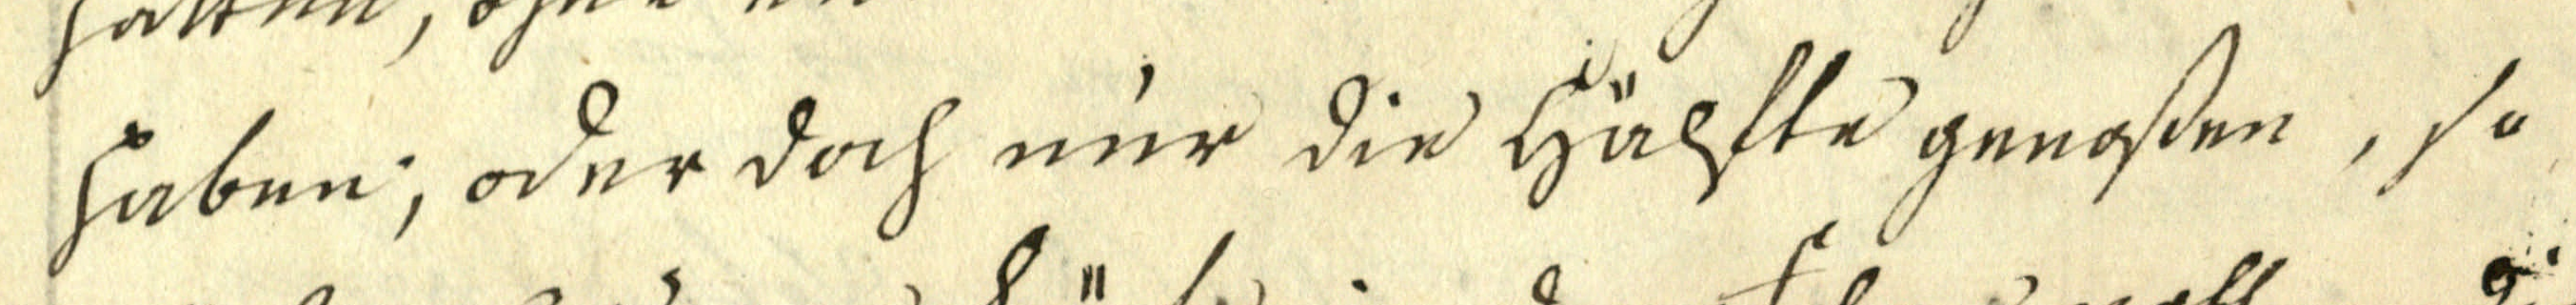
haben, oder doch nur die Hälfte genoßen, so
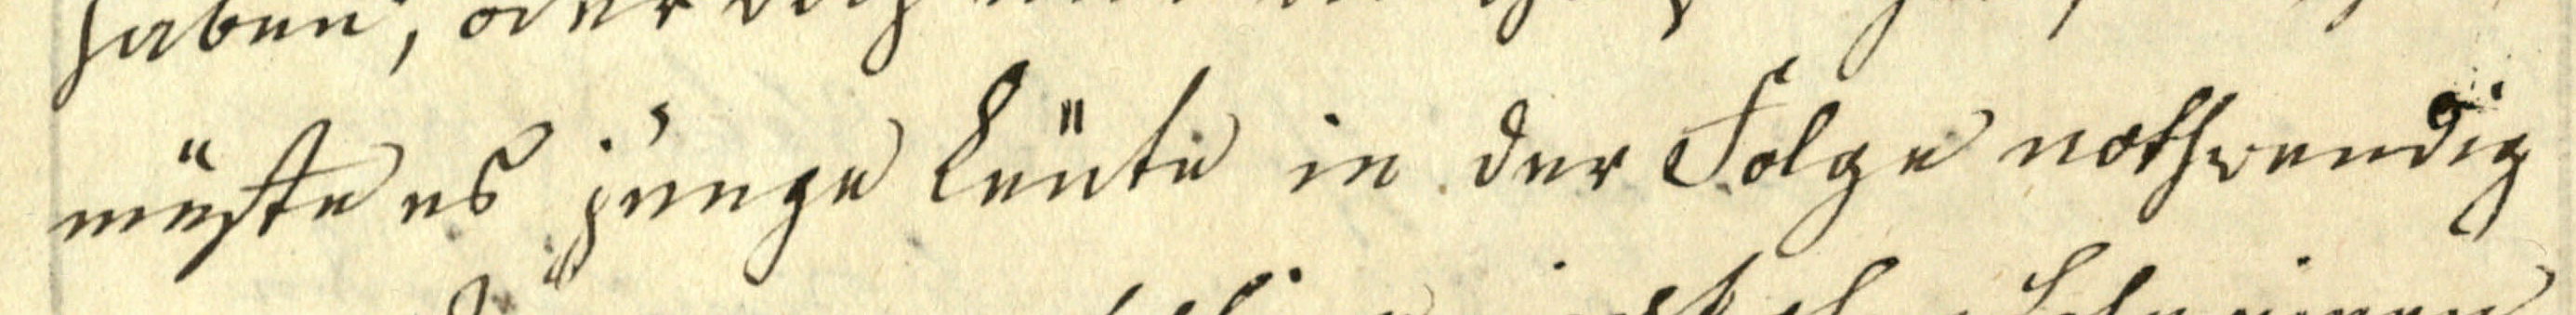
müste es junge Leute in der Folge nothwendig
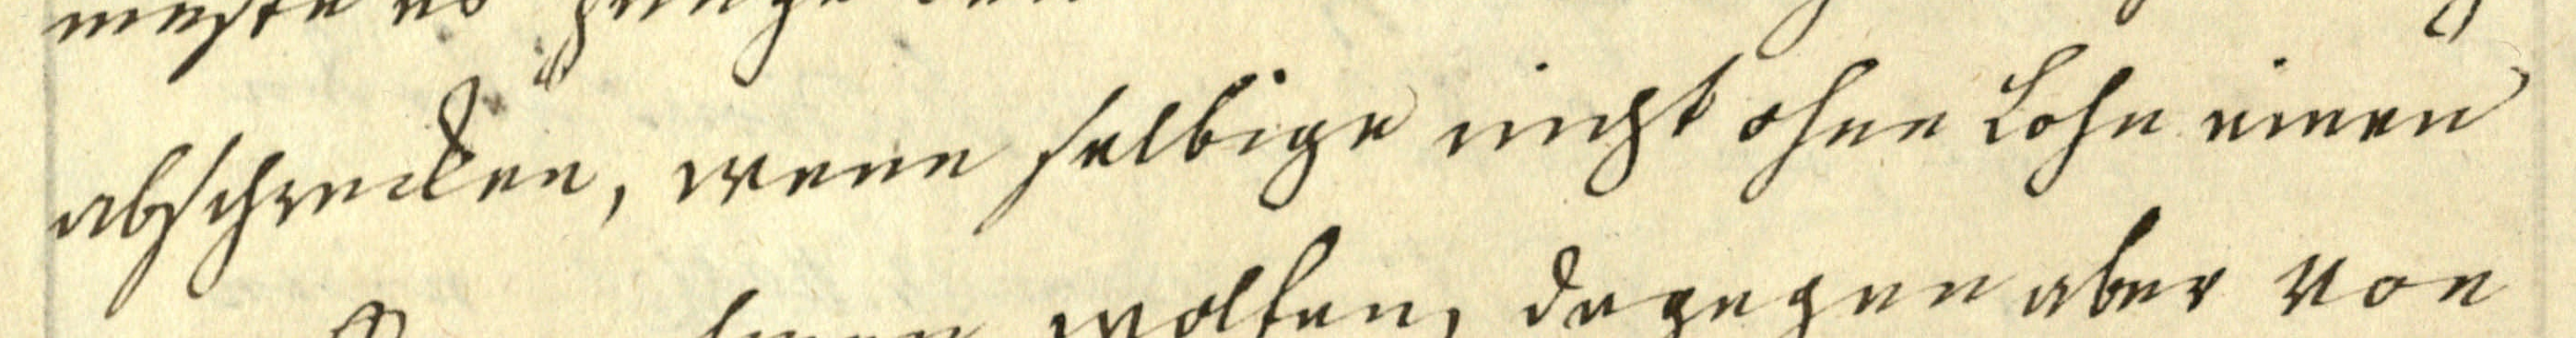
abschrecken, wenn selbige nicht ohne Lohn einen
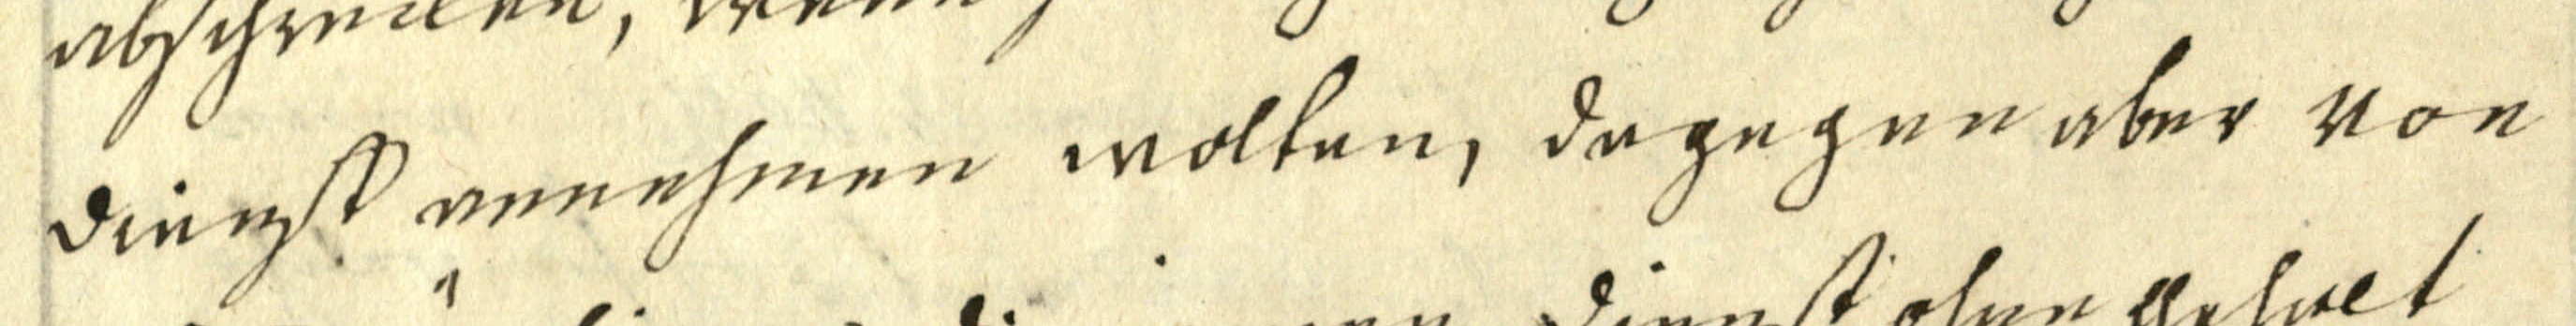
Dienst annehmen wolten, dagegen aber von
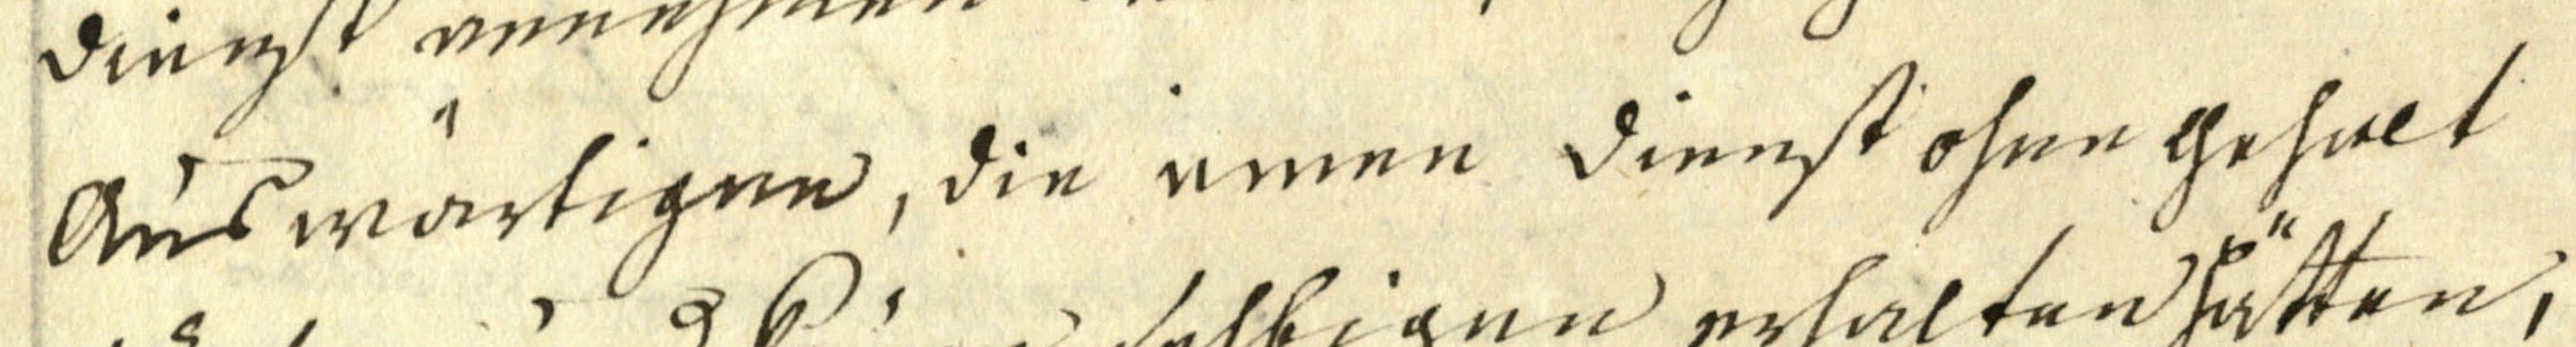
Auswärtigen, die einen Dienst ohne Gehalt
